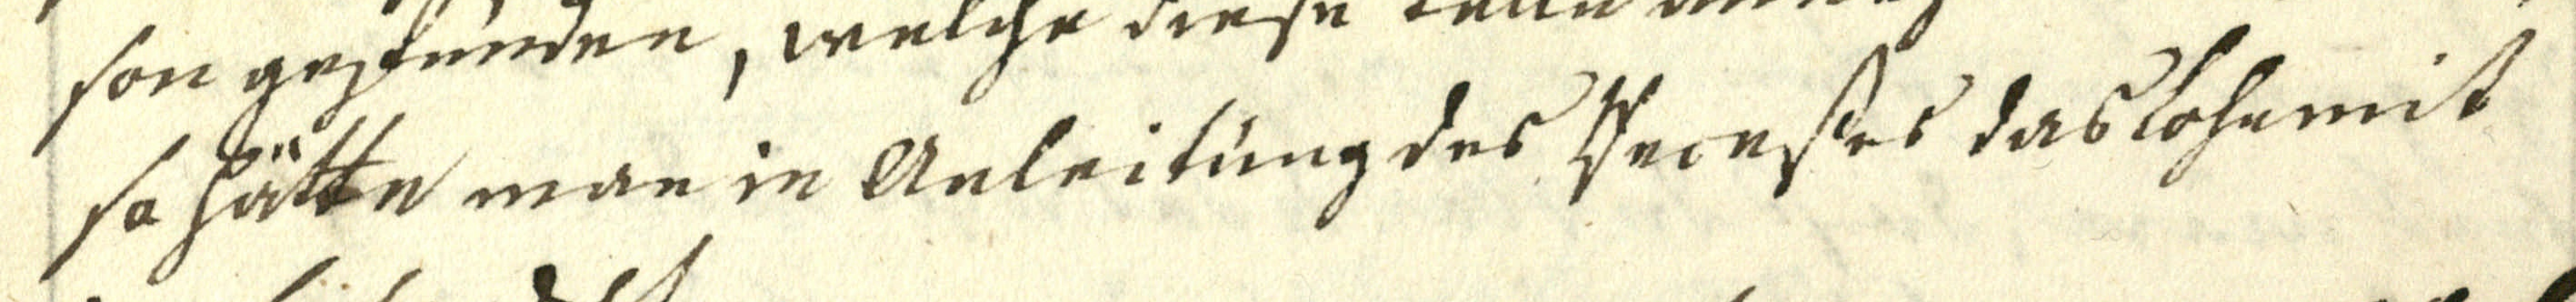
so hätte man in Anleitung des Receßes das Lohn mit
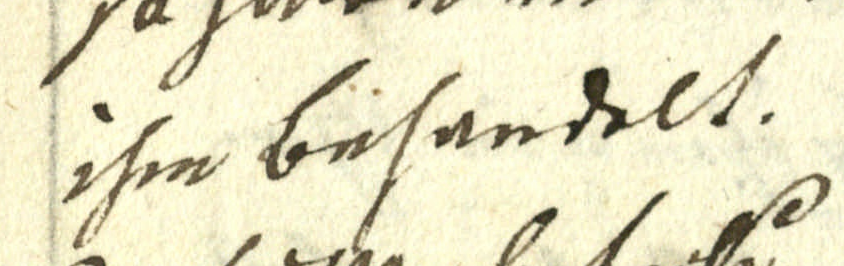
ihm behandelt.
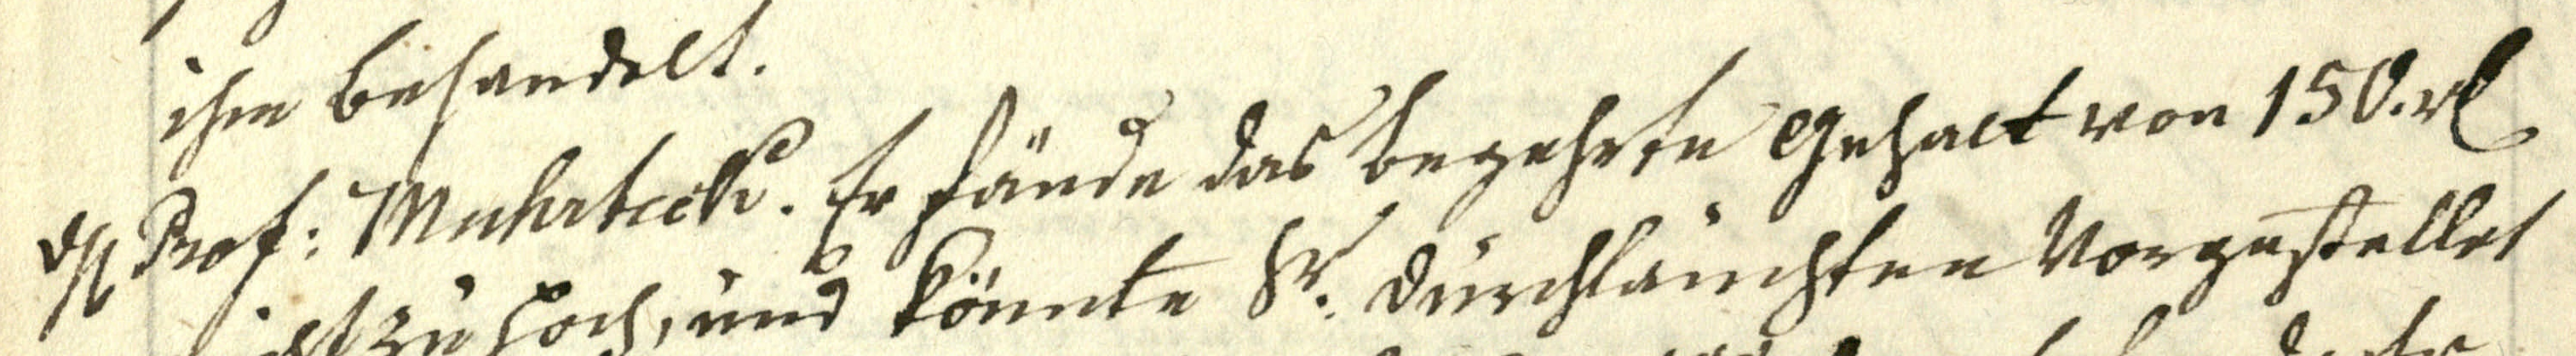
dh Prof. Muhrbeck. Er fände das begehrte Gehalt von 150 r.
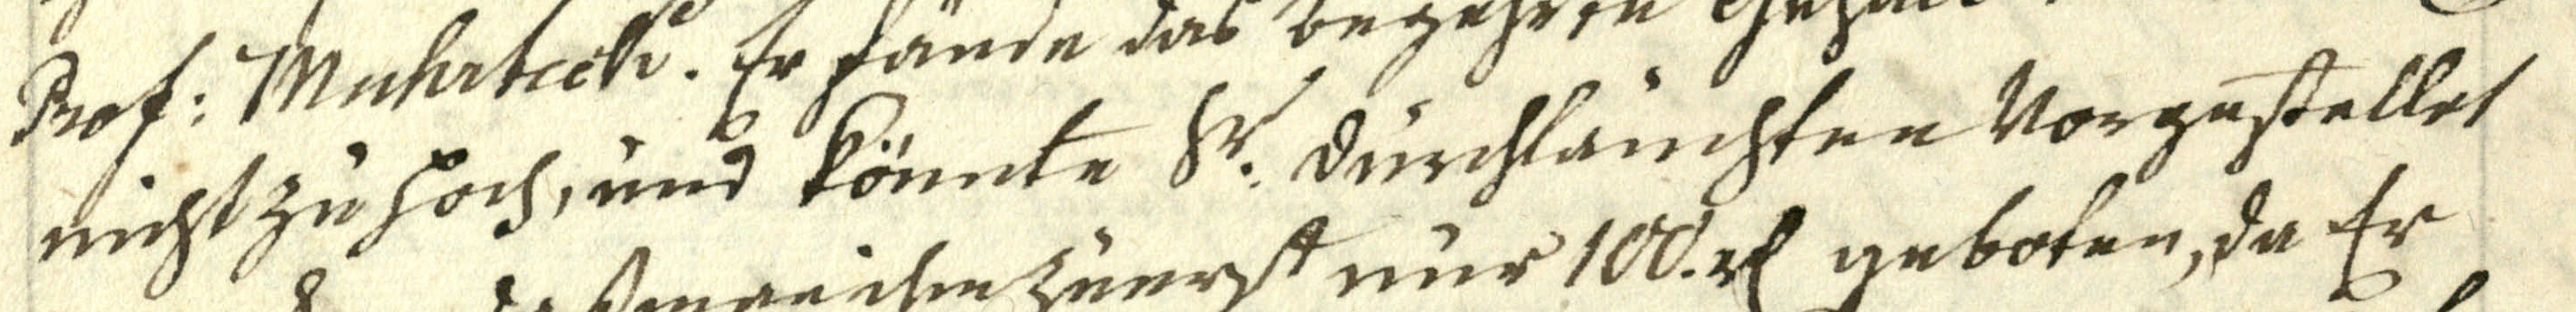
nicht zu hoch, und könnte Sr. Durchlauchten vorgestellet
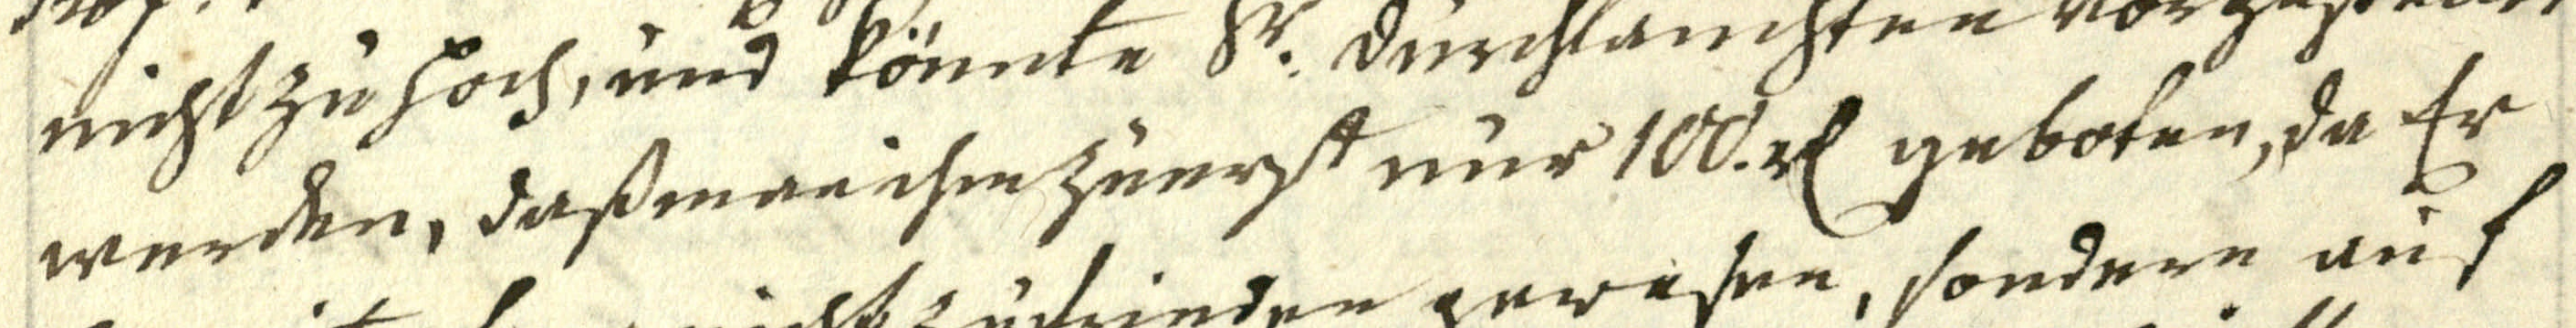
werden, daß man ihm zuerst nur 100 r geboten, da Er
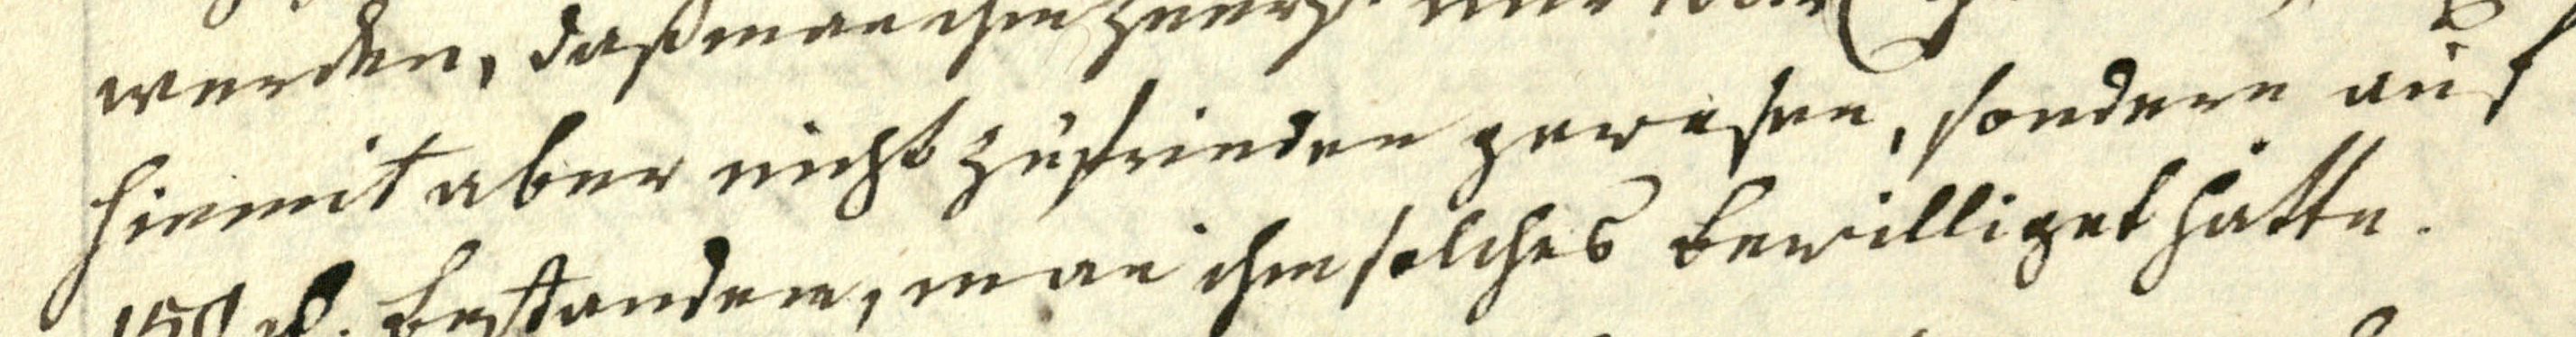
hiemit aber nicht zufrieden gewesen, sondern auf
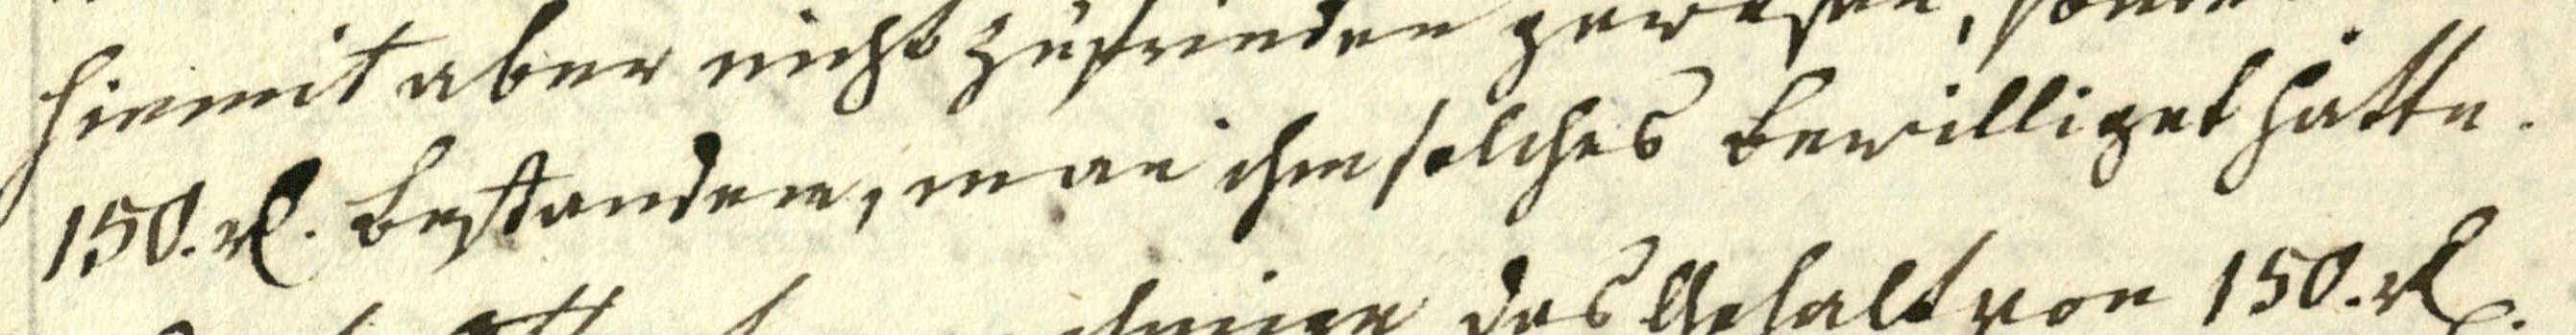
150. r. bestanden, man ihm solches bewilliget hätte.
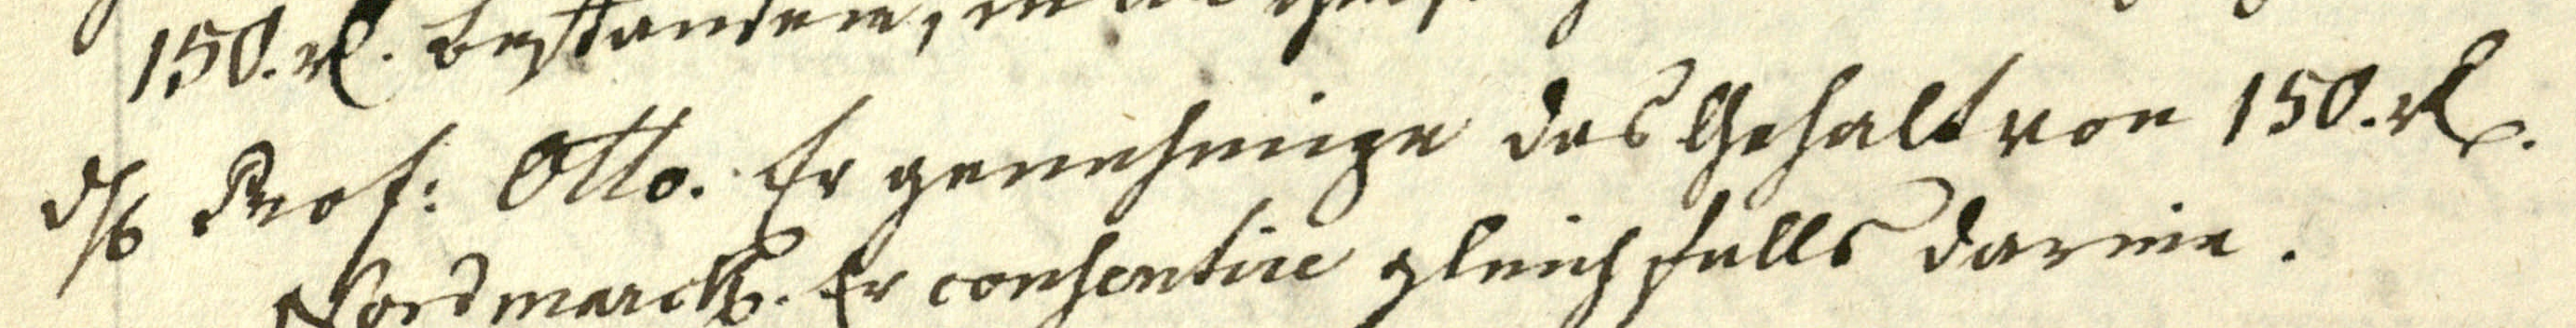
dh Prof. Otto. Er genehmige das Gehalt von 150. r.
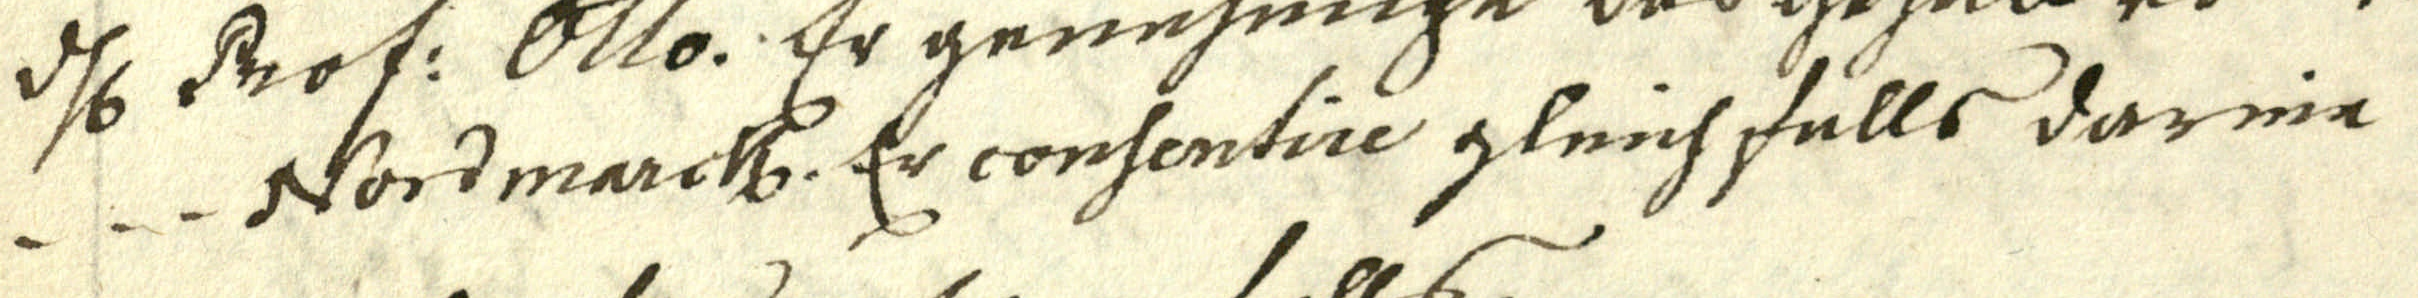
Nordmarck. Er consentire gleich falls darin.
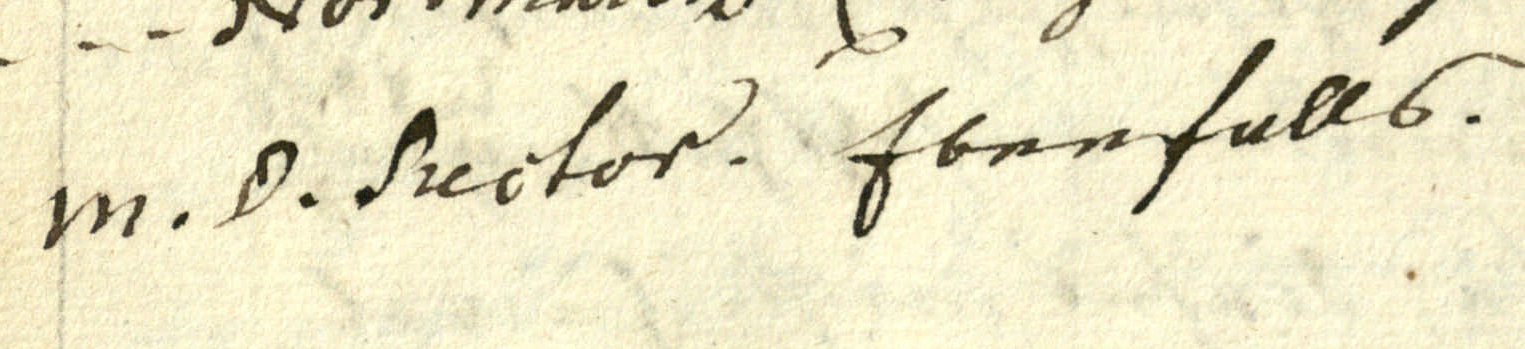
M. D. Rector. Ebenfalls.
